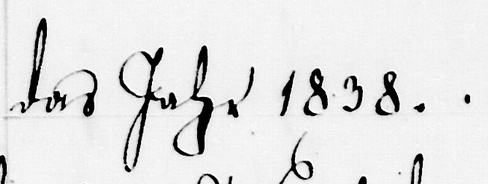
das Jahr 1838.
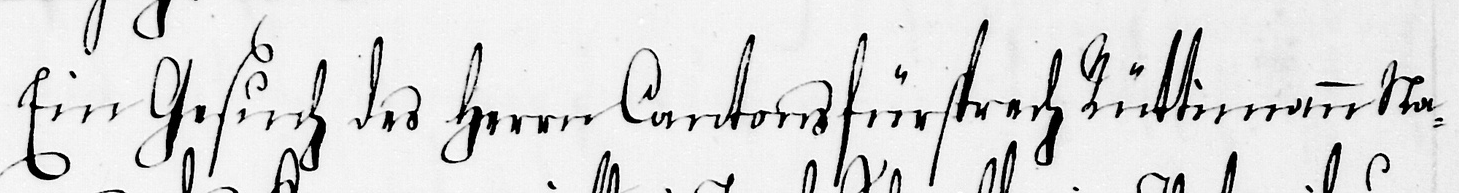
Ein Gesuch des Herrn Cantonsfürsprech Rüttimann Na¬
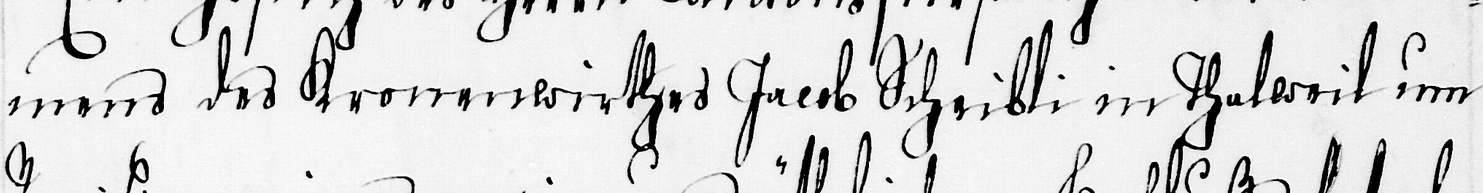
mens des Kronenwirthes Jacob Scheibli in Thalweil um
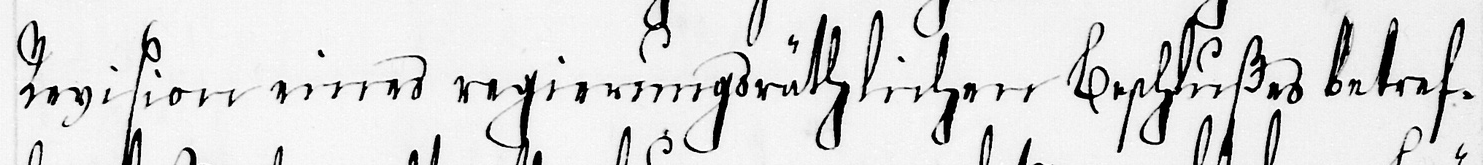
Revision eines regierungsräthlichen Beschlußes betref¬
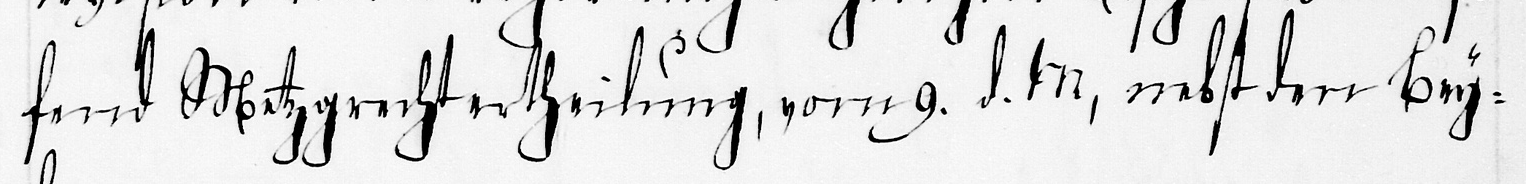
fend Metzgrechtertheilung, vom 9. d. M, nebst den Bey¬
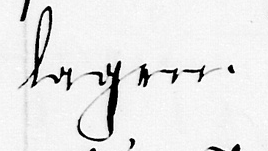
lagen.
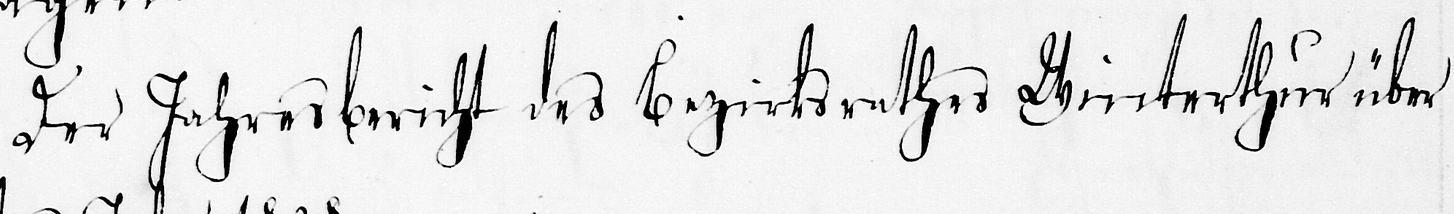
Der Jahresbericht des Bezirksrathes Winterthur über
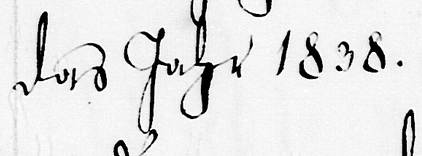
das Jahr 1838.
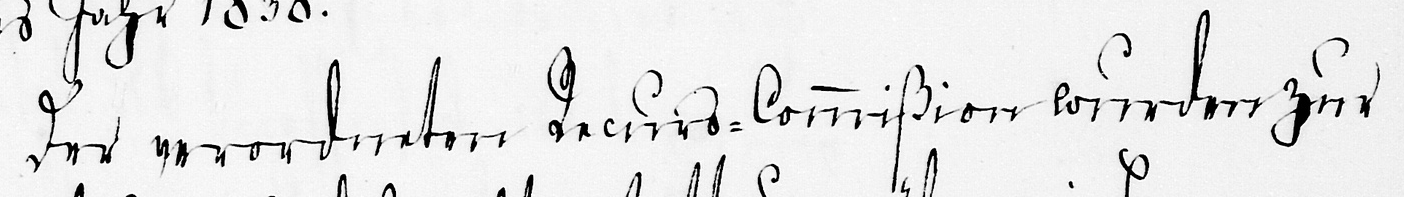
Der verordneten Recurs-Commißion wurden zur
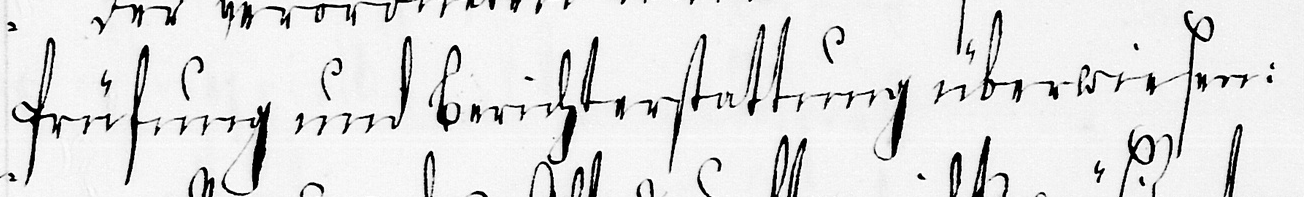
Prüfung und Berichterstattung überwiesen:
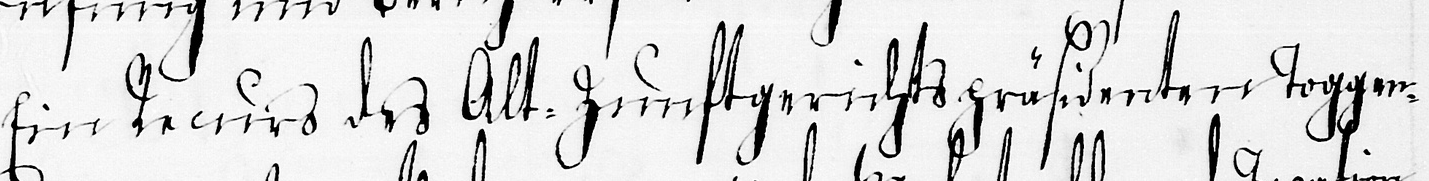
Ein Recurs des Alt-Zunftgerichtspräsidenten Toggen¬
